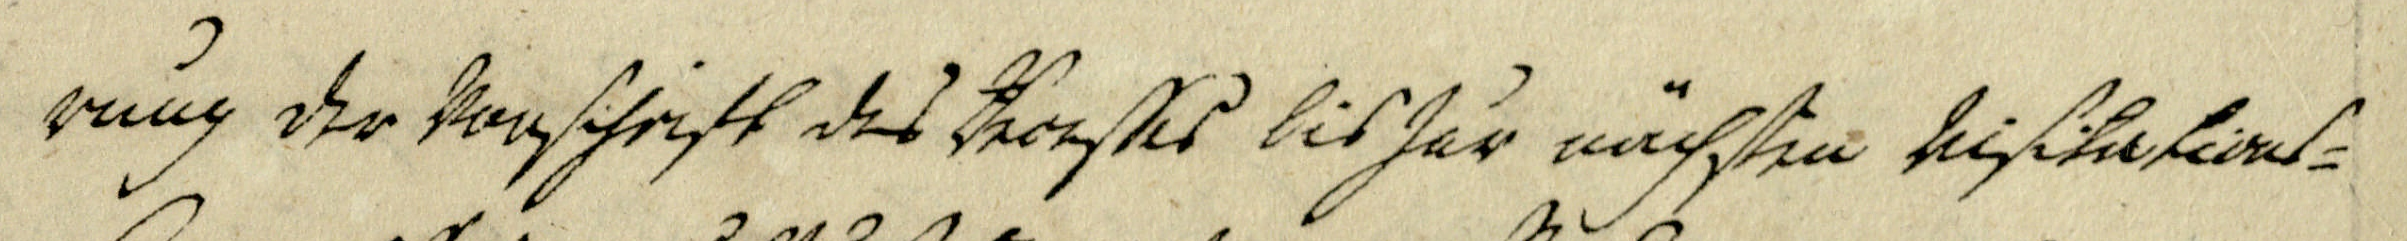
rung der Vorschrift des Recesses bis zur nächsten Visitations-
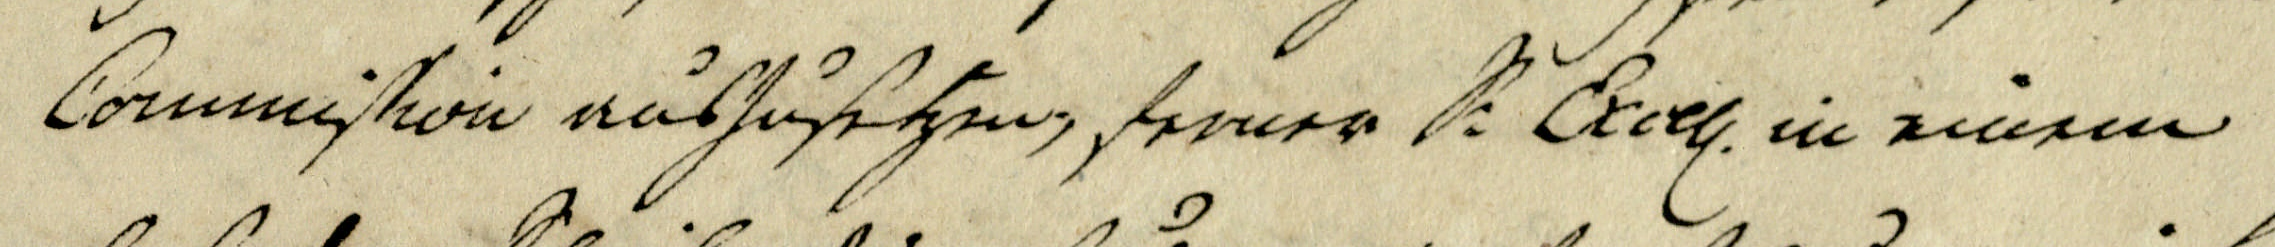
Commission auszusetzen, seiner Sr. Excel. in einem
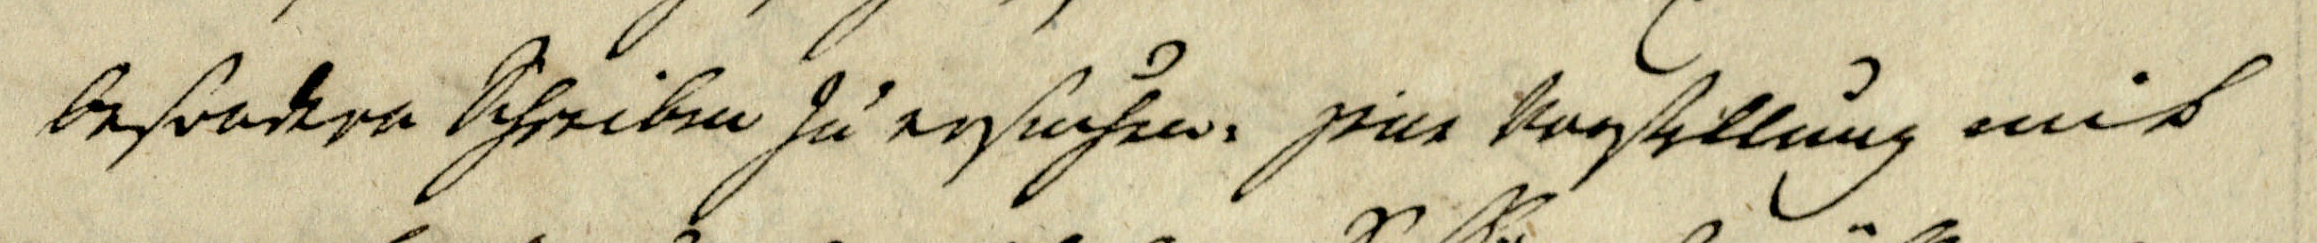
besondern Schreiben zu ersuchen: jene Vorstellung mit
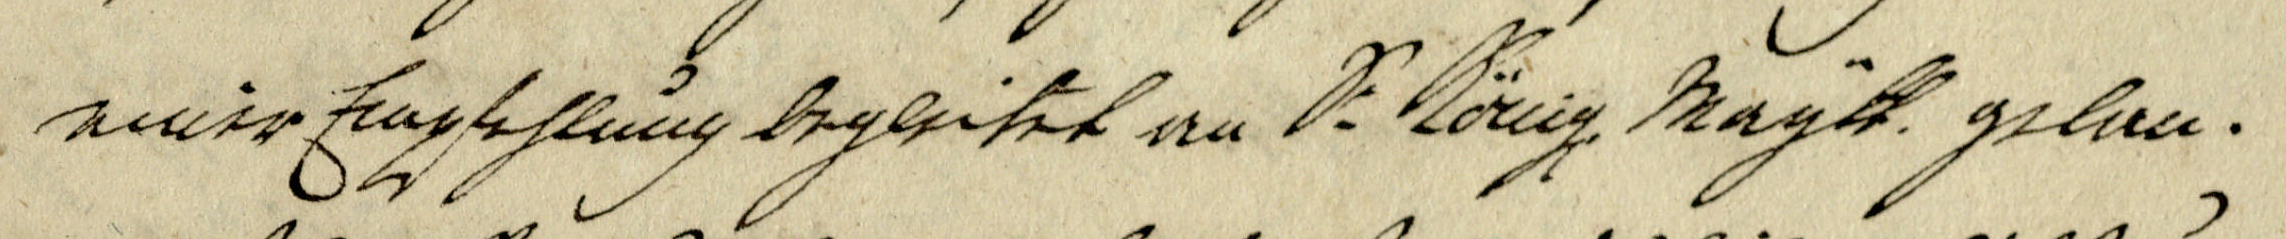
einer Empfehlung begleitet an Sr. Königl Maÿtt. gelan¬
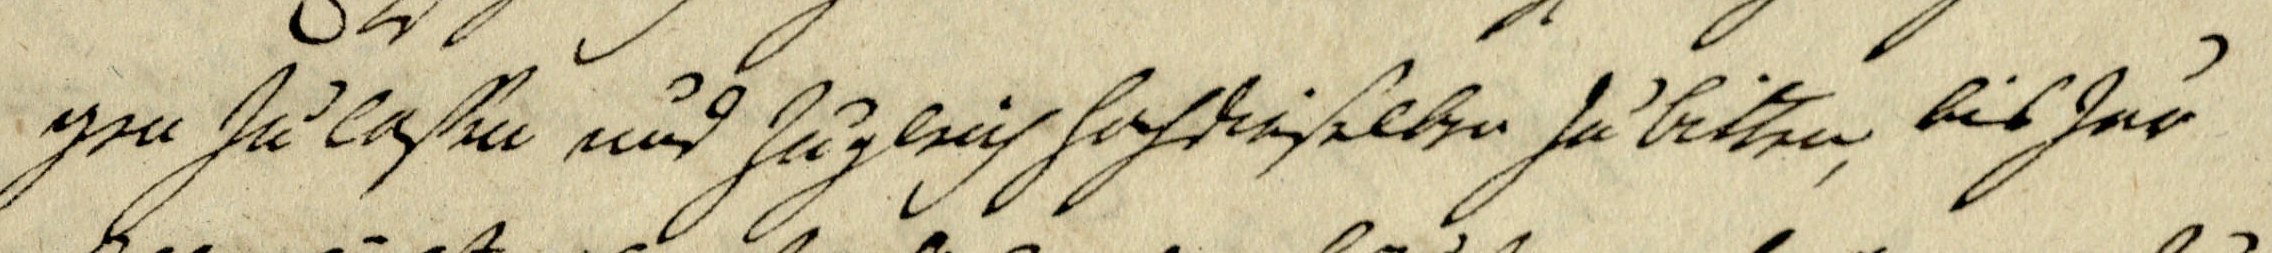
gen zu lassen und zugleich hochdieselben zu bitten, bis zur
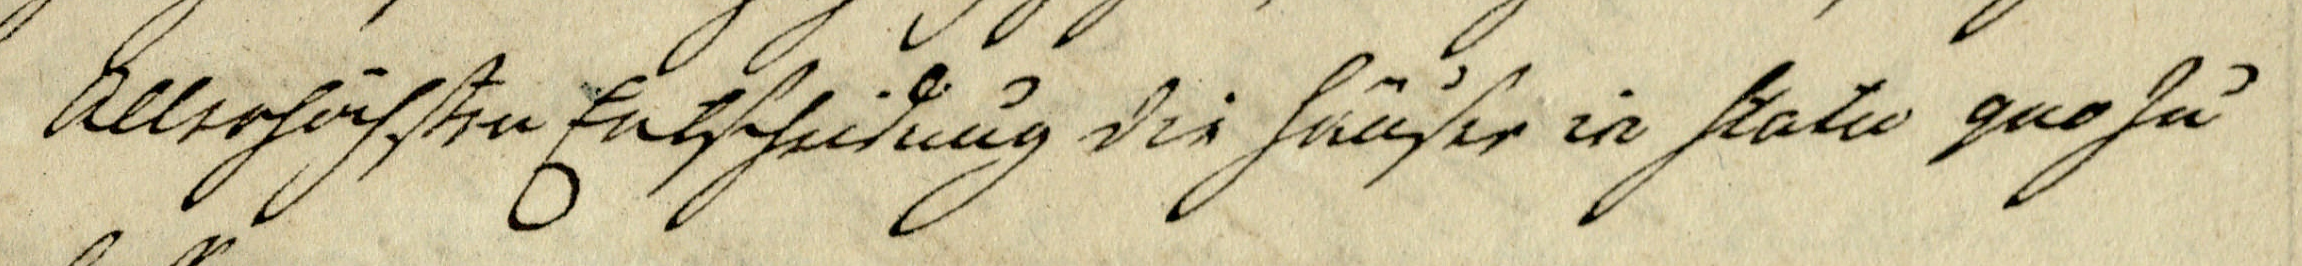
Allerhöchsten Entscheidung die Häuser in statu quo zu
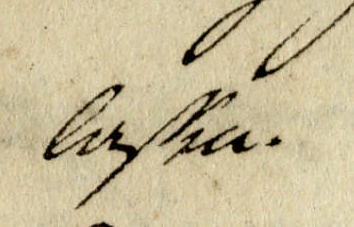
lassen.
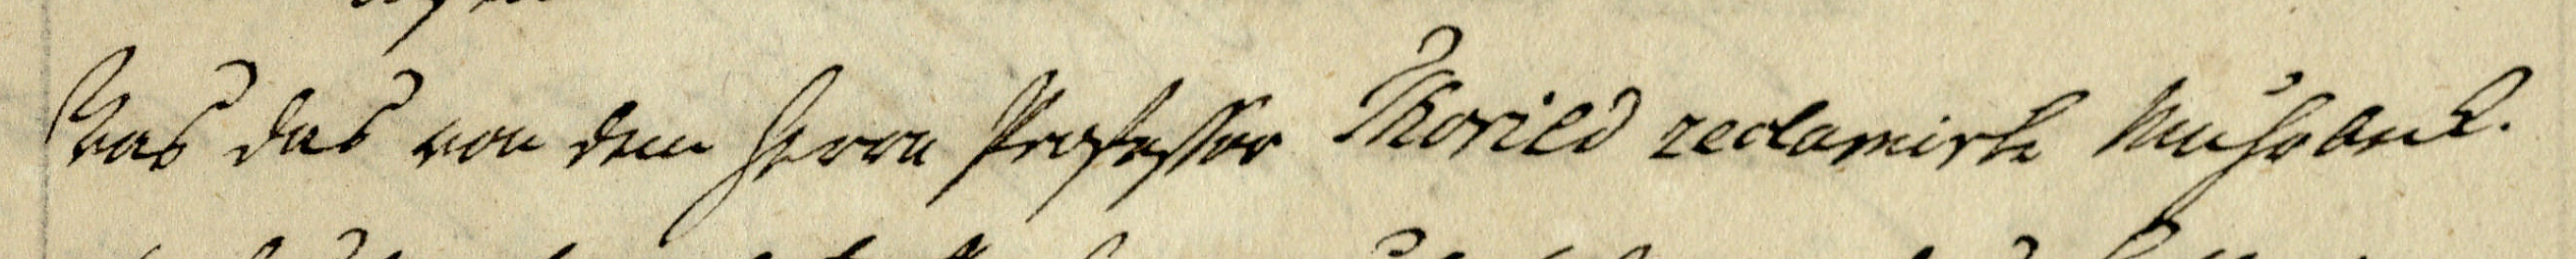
Was das von dem Herrn Professor Thorild reclamirte Muhrbeck¬
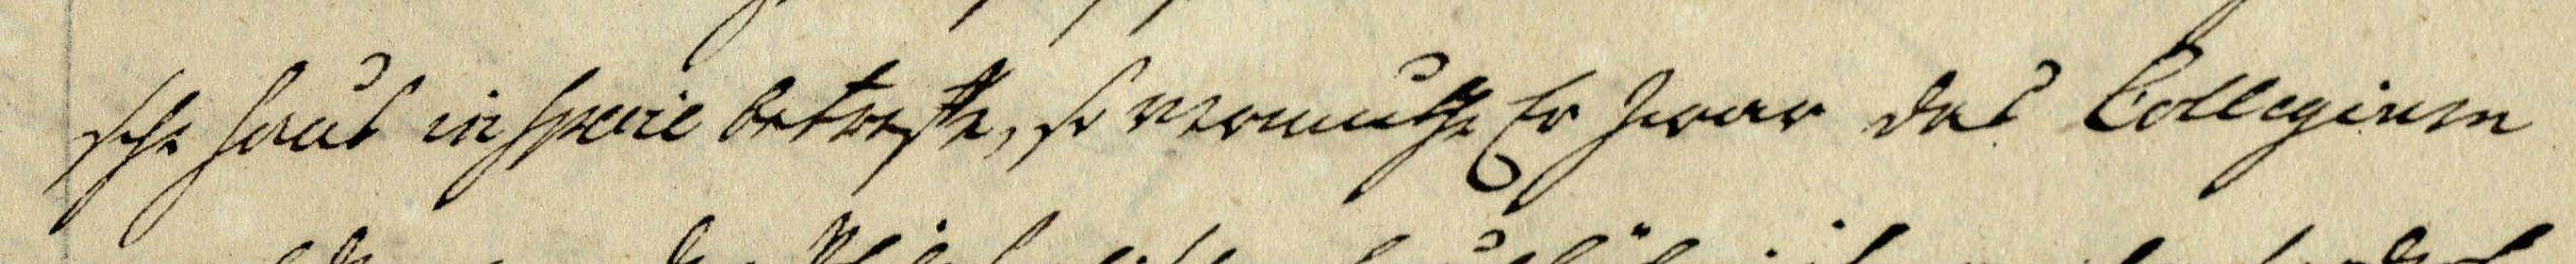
sche Haus in specie betreffe, so vermuthe Er zwar das Collegium
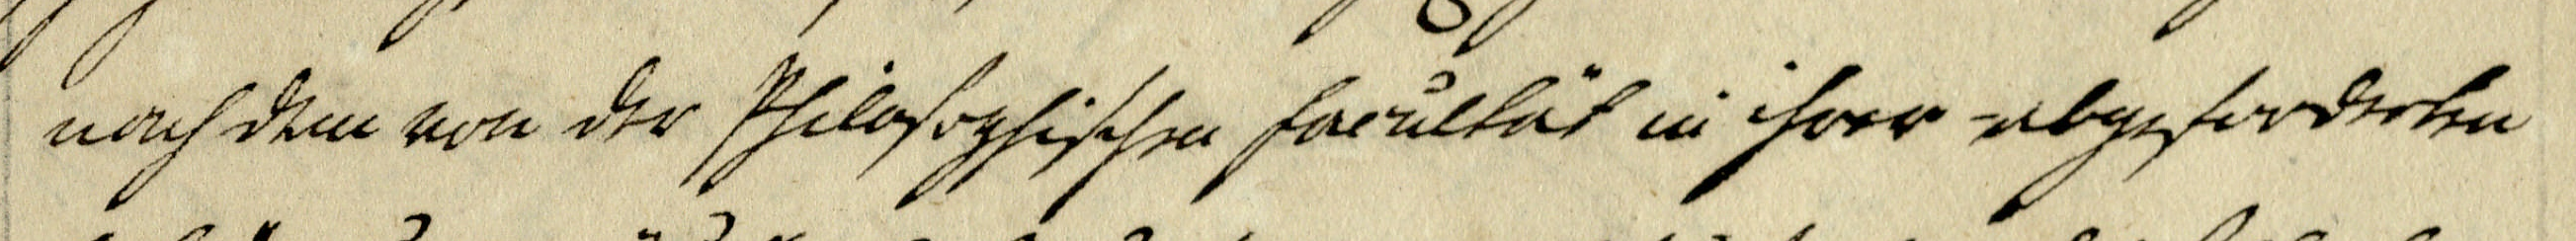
nach dem von der Philosophischen Facultät in ihrer abgeforderten
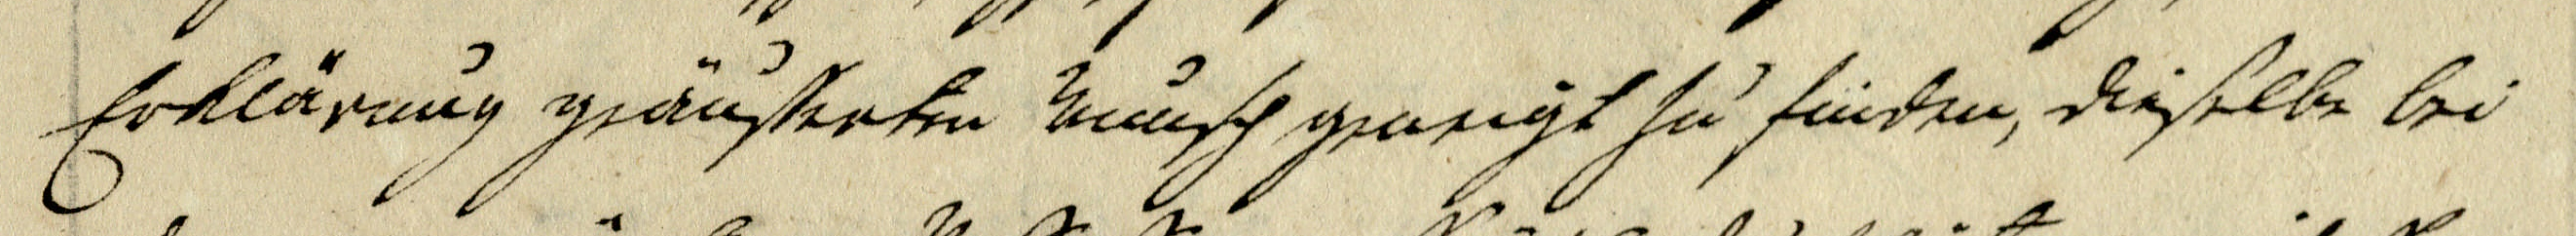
Erklärung geäusserten Wunsch geneigt zu finden, dieselbe bei
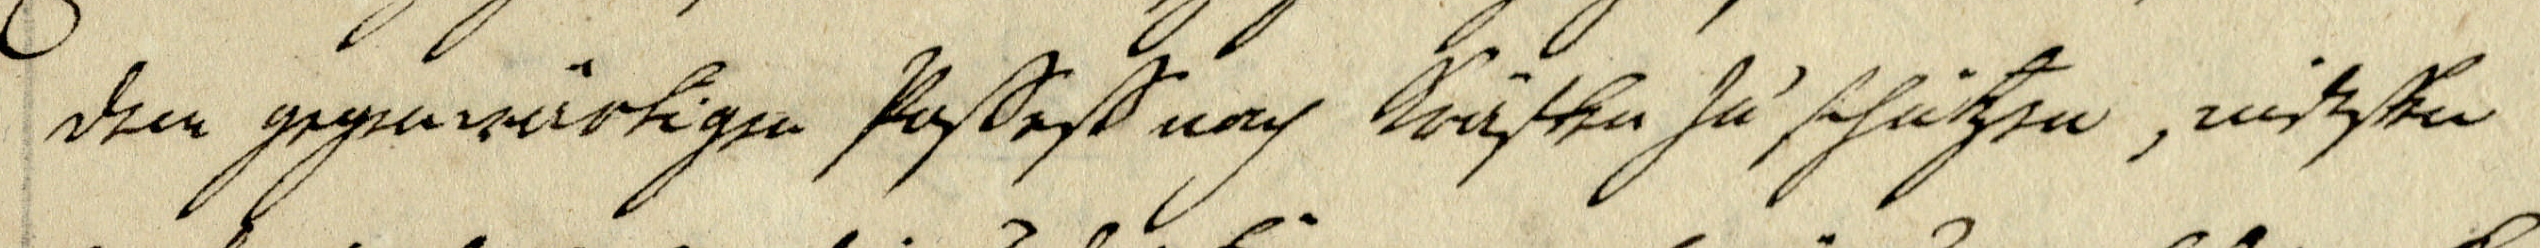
dem gegenwärtigen Passus nach Kräften zu schützen, indessen
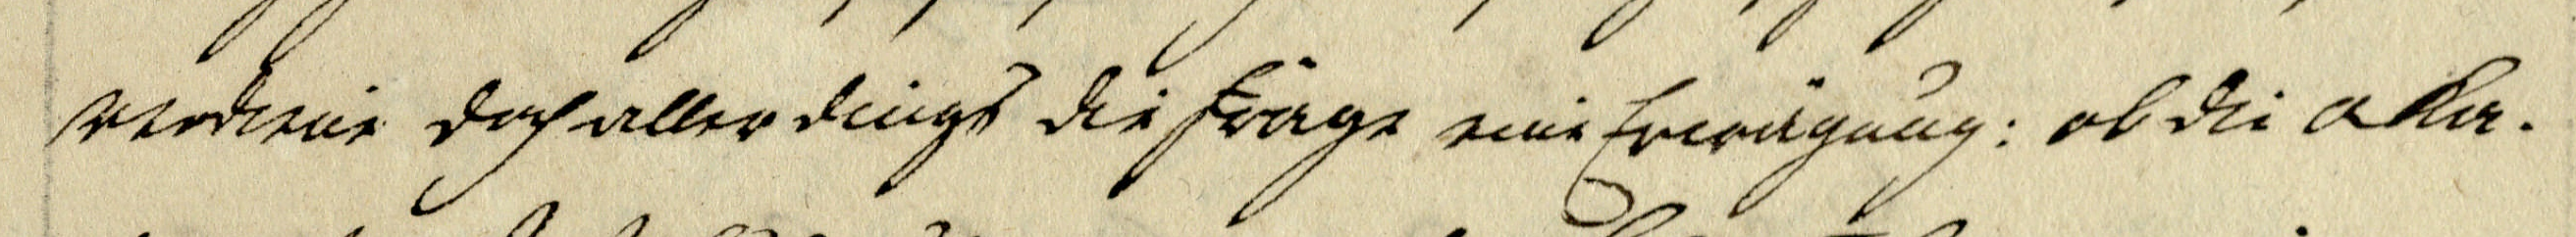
verdiene doch allerdings die Frage eine Erwägung: ob die aka¬
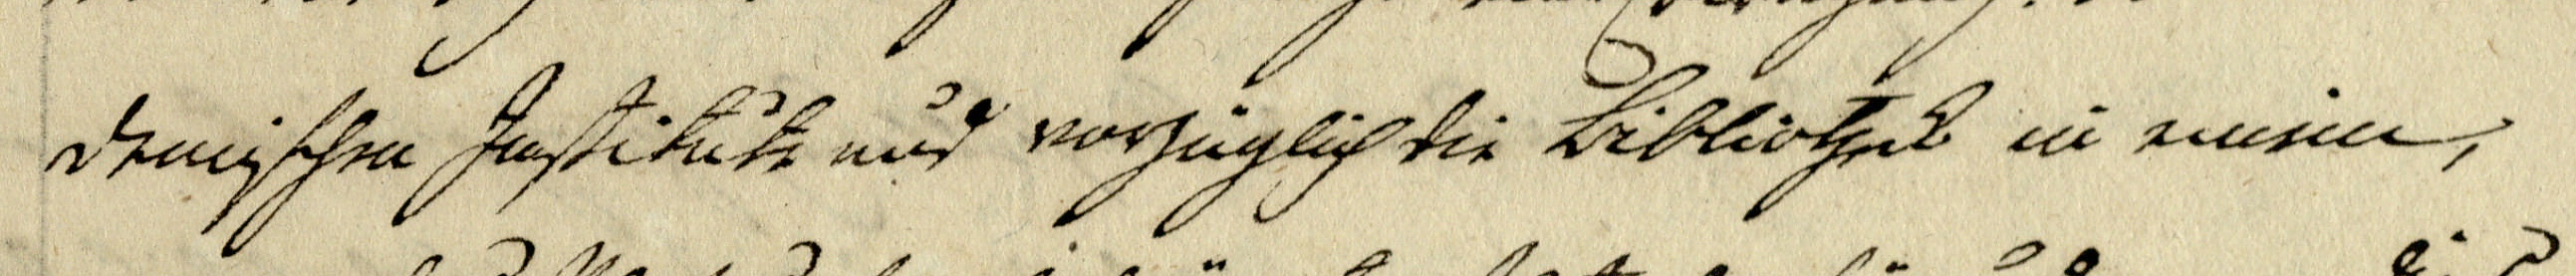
demischen Institute und vorzüglich die Bibliothek in einem,
